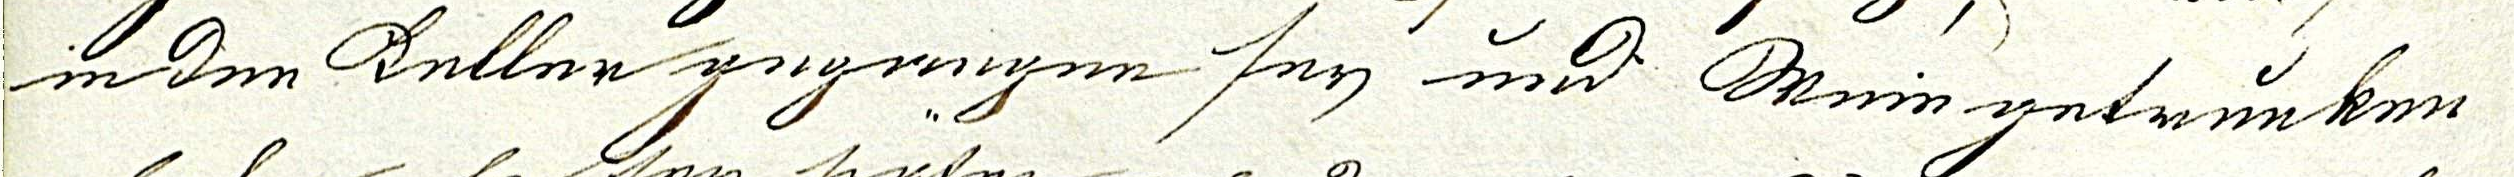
in den Keller gegangen sey und Wein getrunken
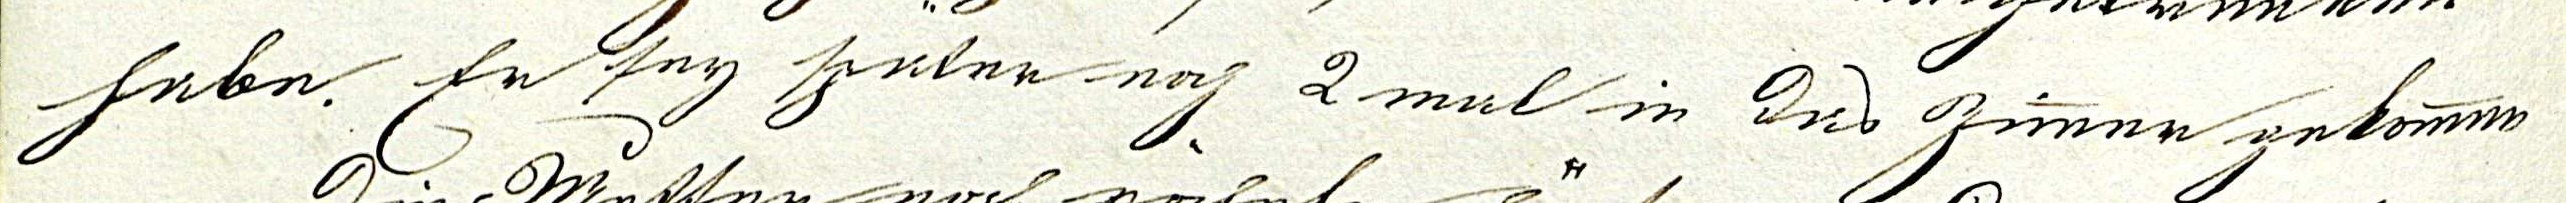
habe. Er sey später noch 2mal in das Zimmer gekommen
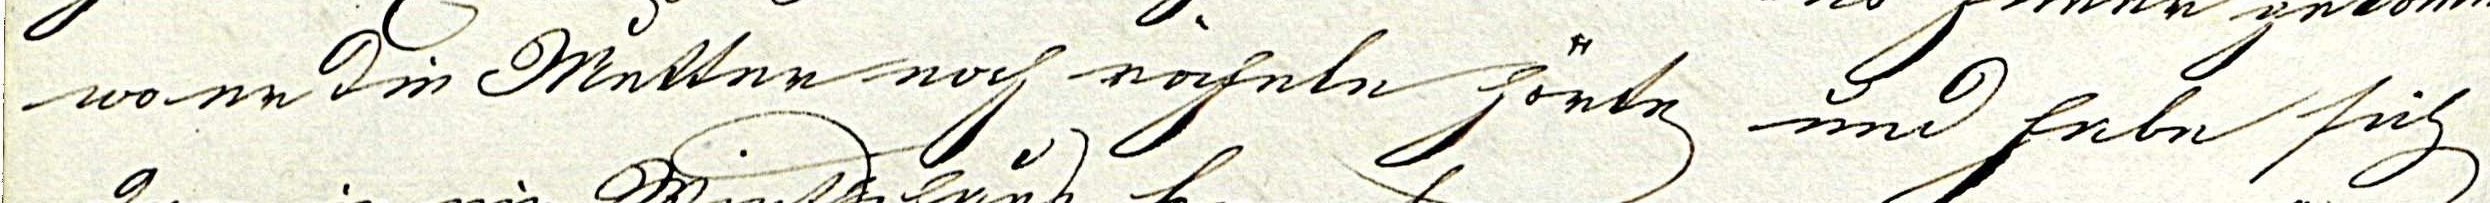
wo er die Mutter noch röcheln hörte und habe sich
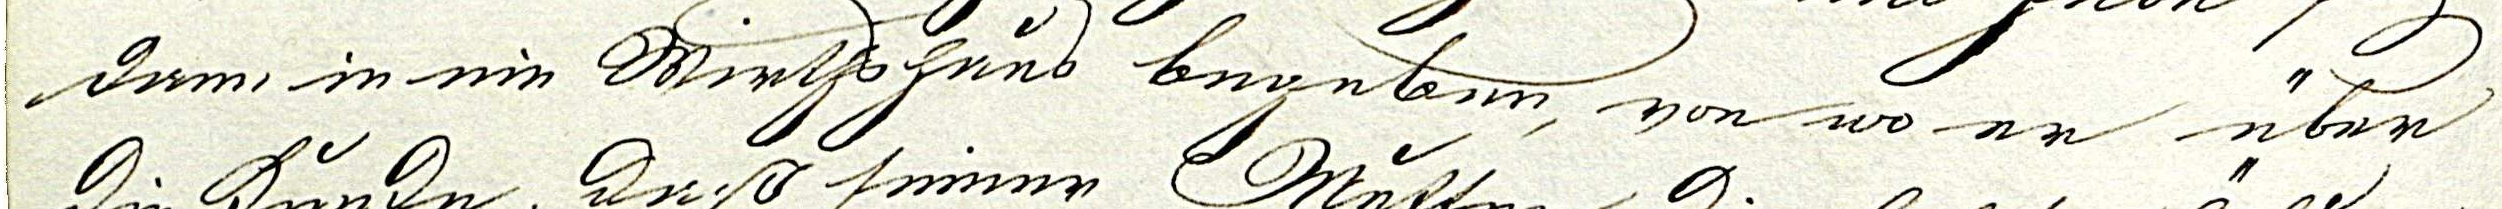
dann, in ein Wirtshaus begeben, von wo er über
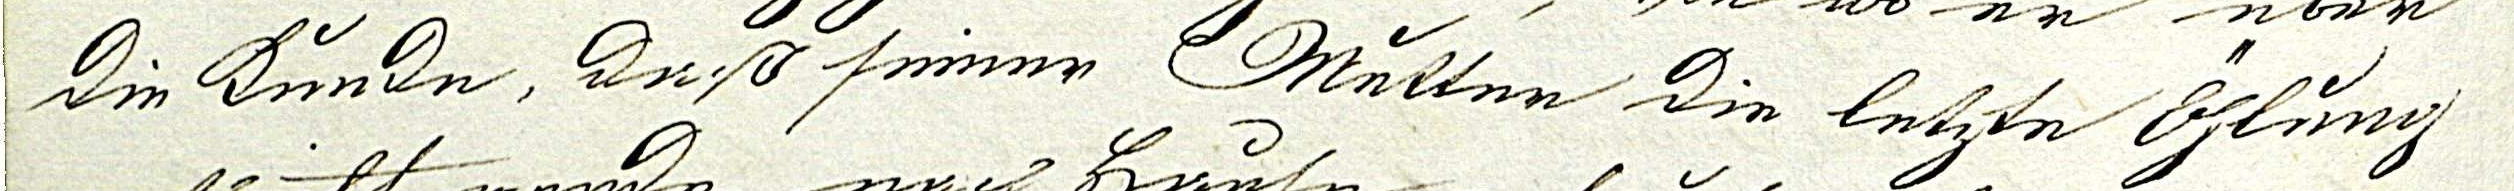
die Kunde, daß seiner Mutter die letzte Öhlung
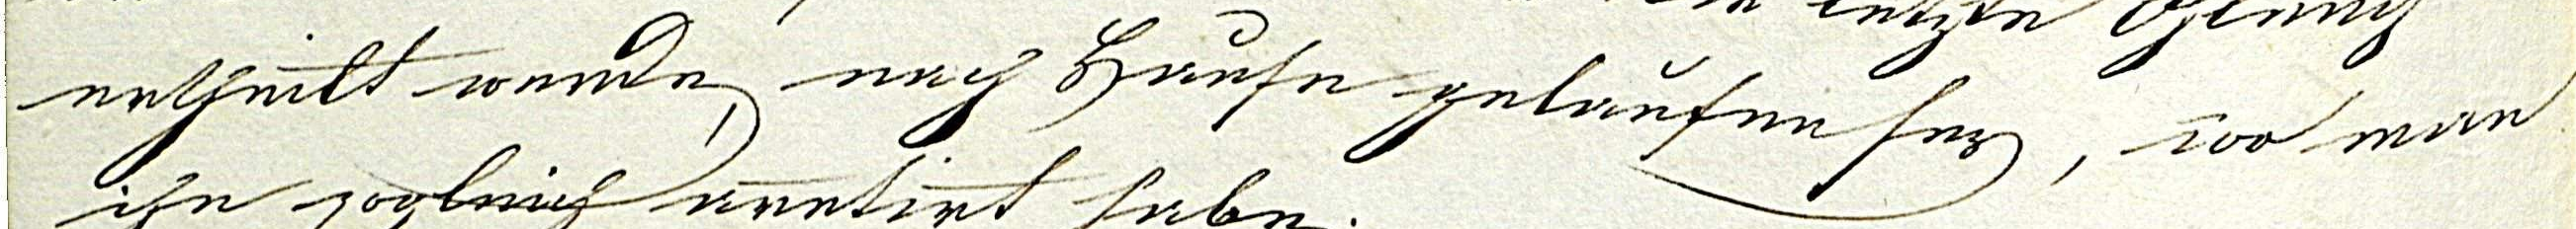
ertheilt werde, nach Hause gelaufen sey, wo man
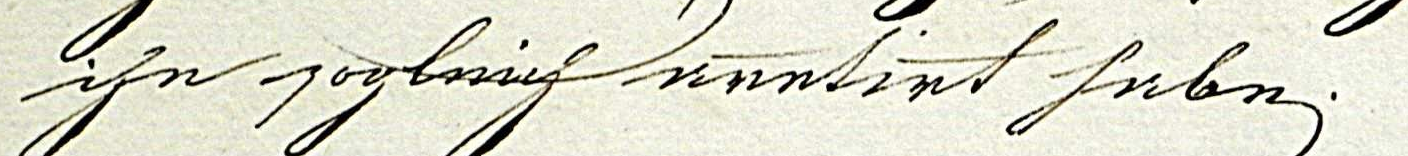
ihn sogleich arretirt habe.
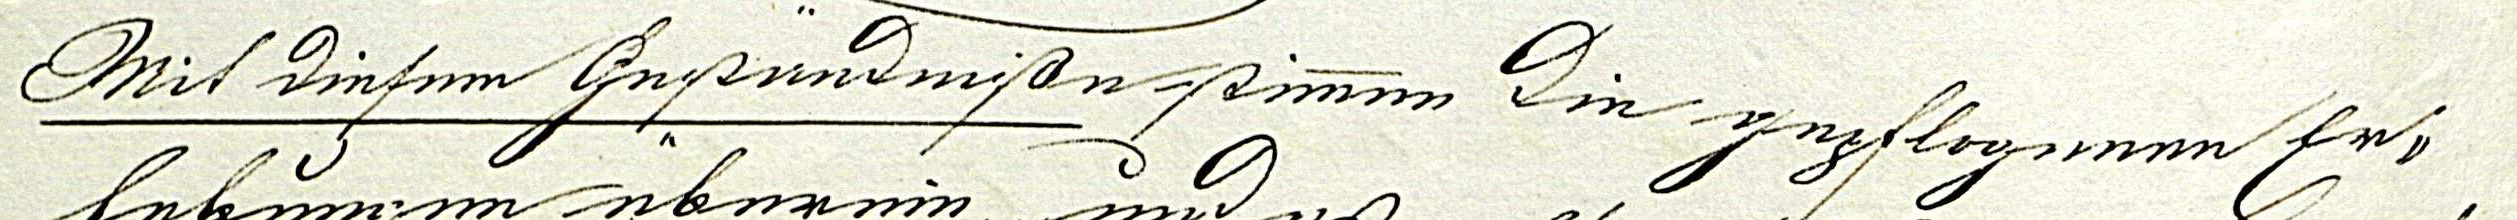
Mit diesem Geständniße simmen die gepflogenen Er¬
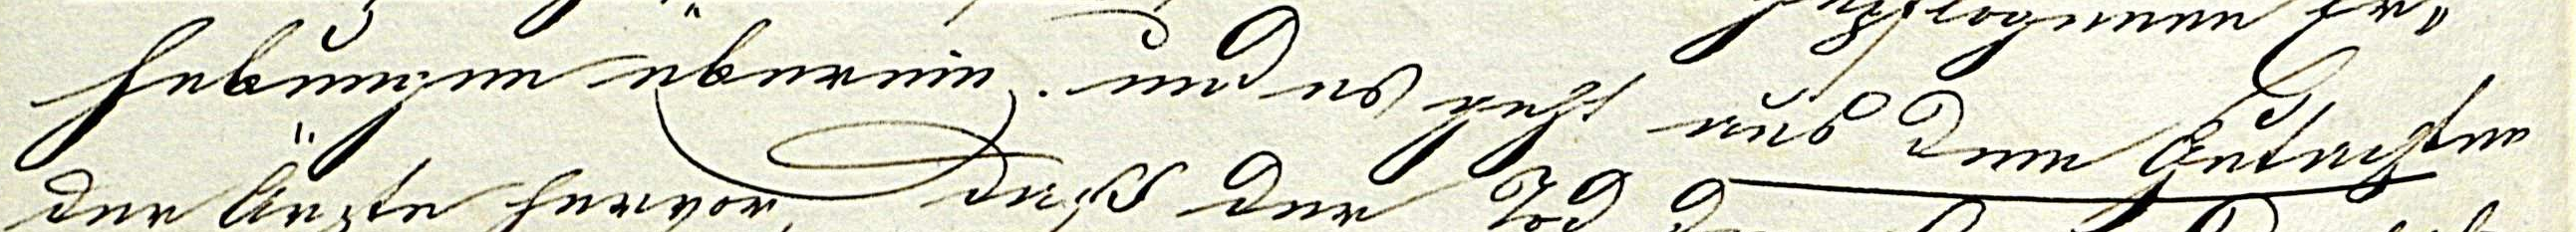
hebungen überein und es geht aus dem Gutachten
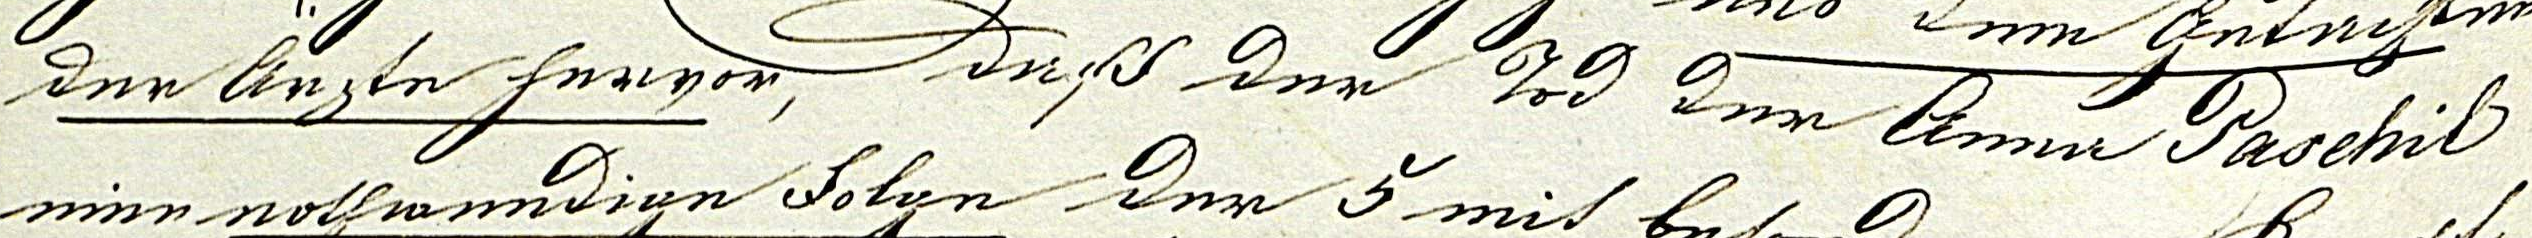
der Ärzte hervor, daß der Tod der Anna Paschil
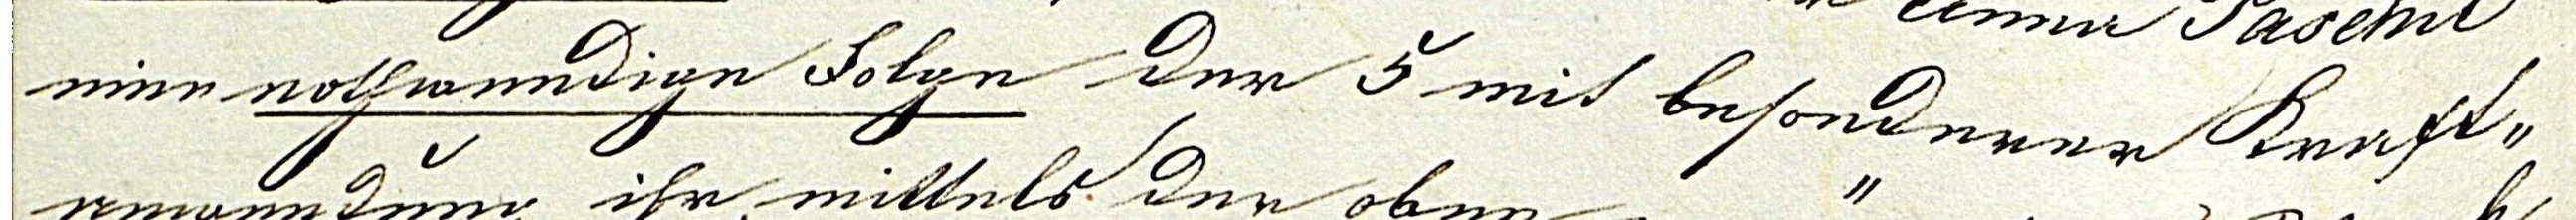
eine nothwendige Folge der 5 mit besonderer Kraft¬
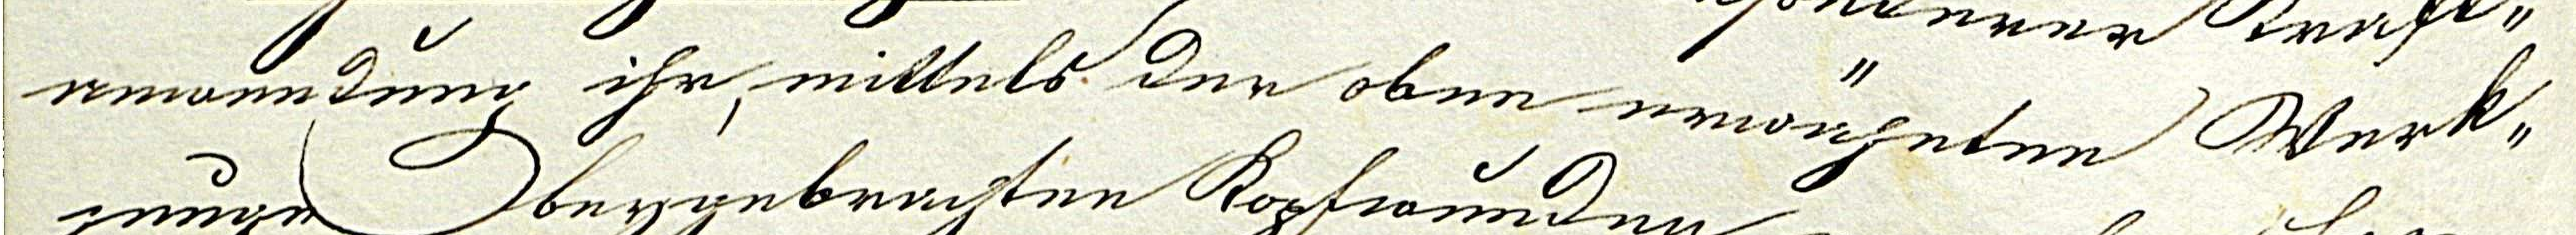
anwendung ihr, mittels der oben erwähnten Werk¬
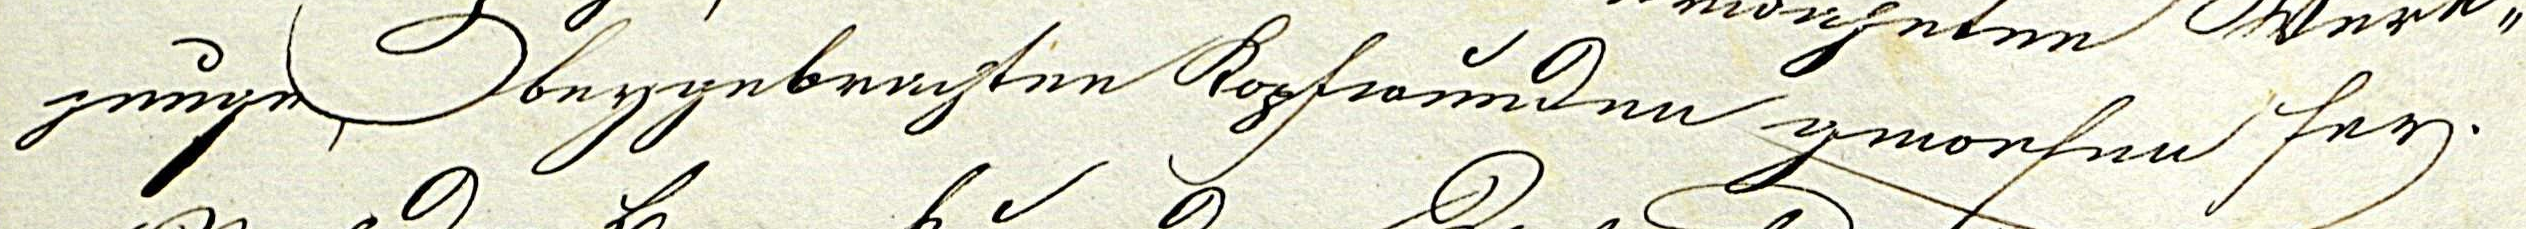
zeuge, beygebrachten Kopfwunden gewesen sey.
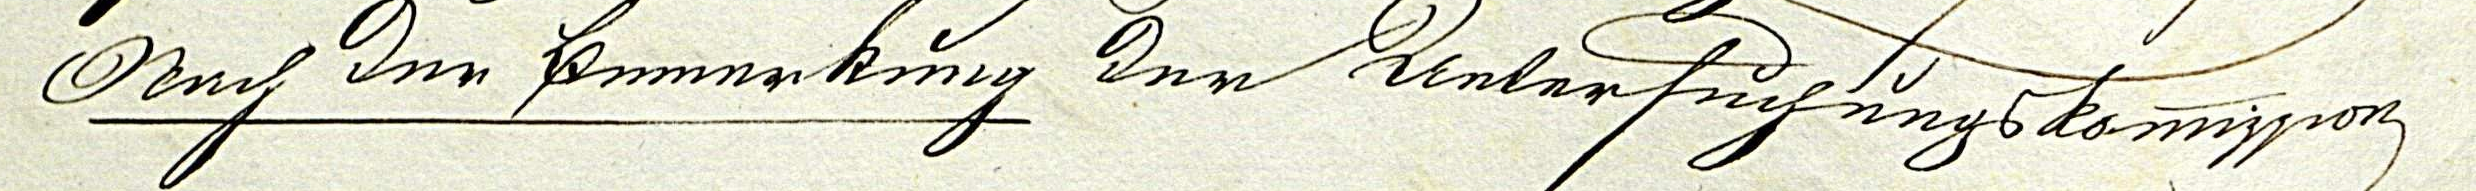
Nach der Bemerkung der Untersuchungskommission
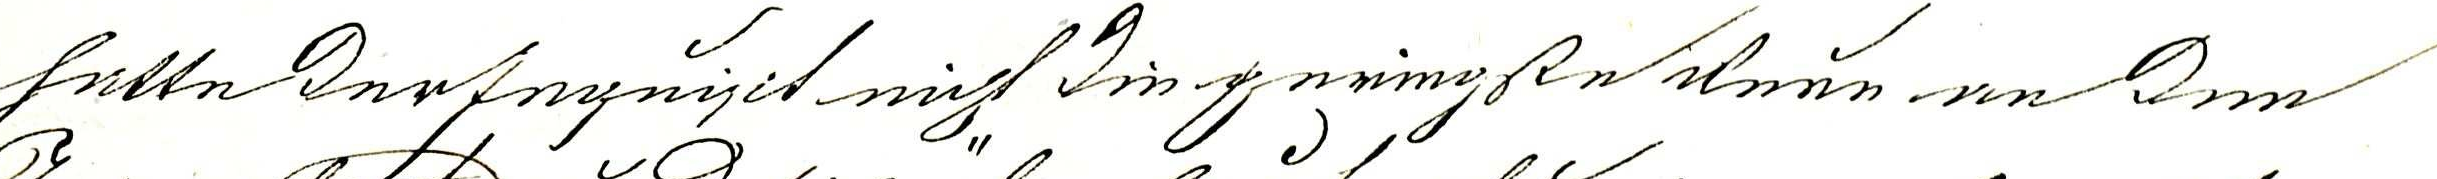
hatte der Inquisit nicht die gerinste Reue an den
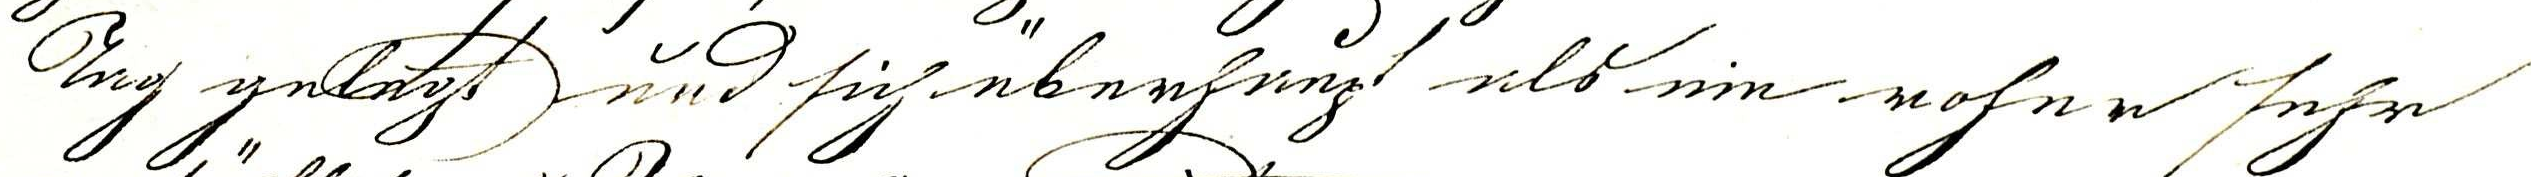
Tag gelegt und sich überhaupt als ein roher sehr
